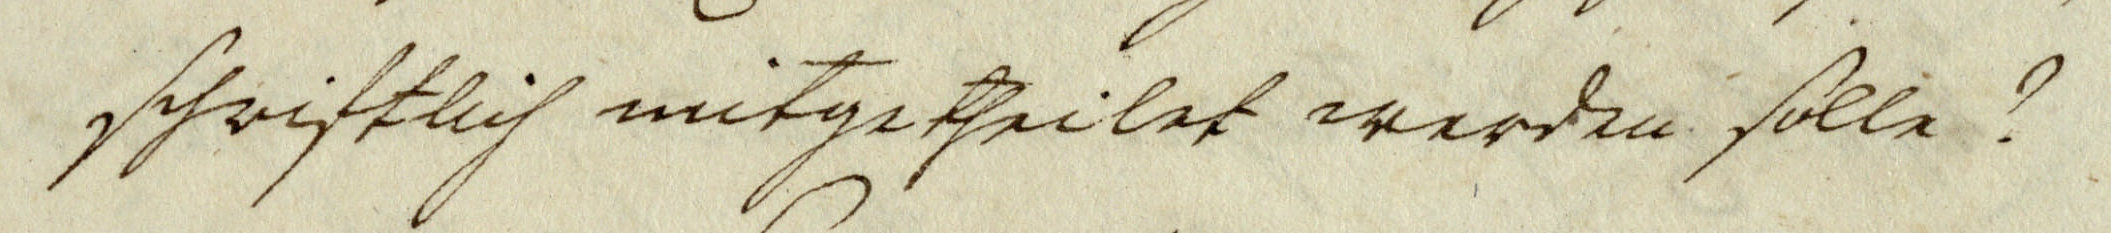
schriftlich mitgetheilt werden solle?
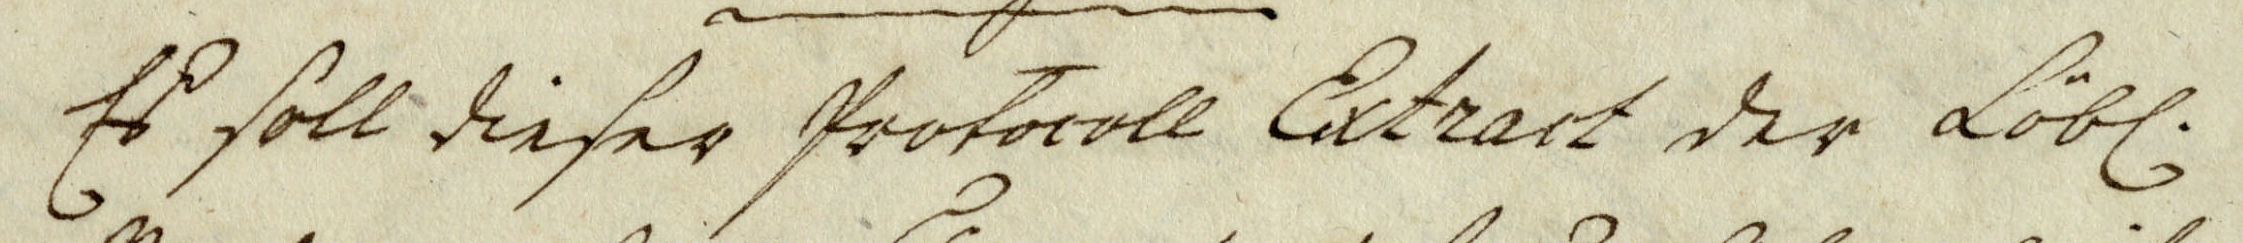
Es soll diser Protocoll Extract der Löbl.
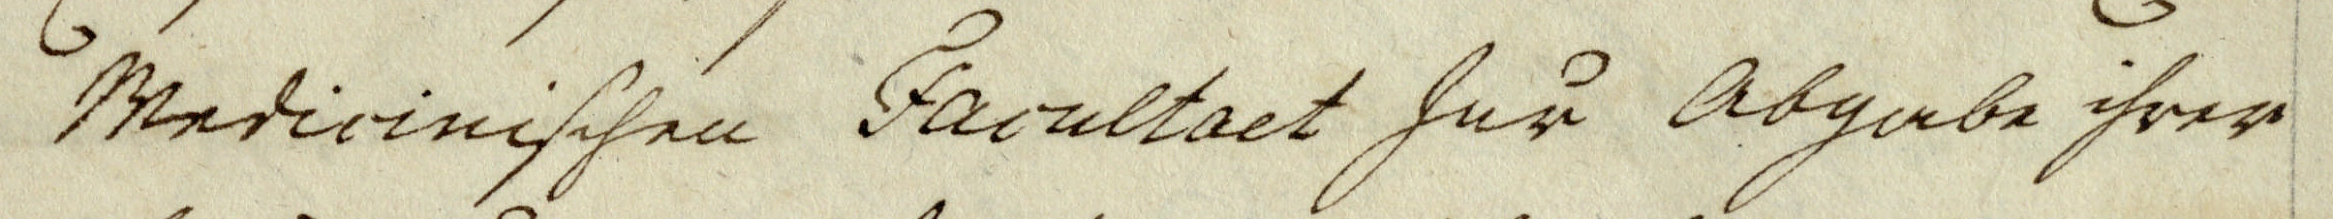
Medicinischen Facultaet zur Abgabe ihrer
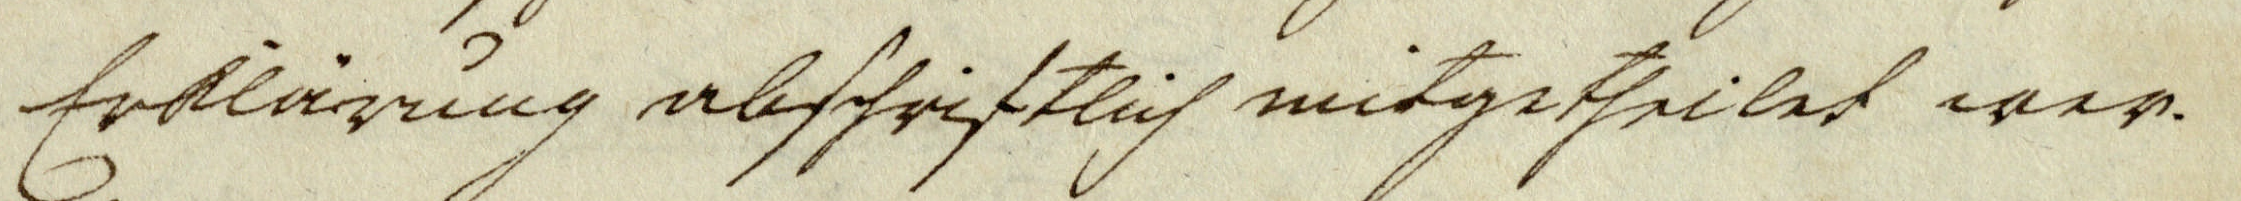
Erklärung abschriftlich mitgetheilt wer¬
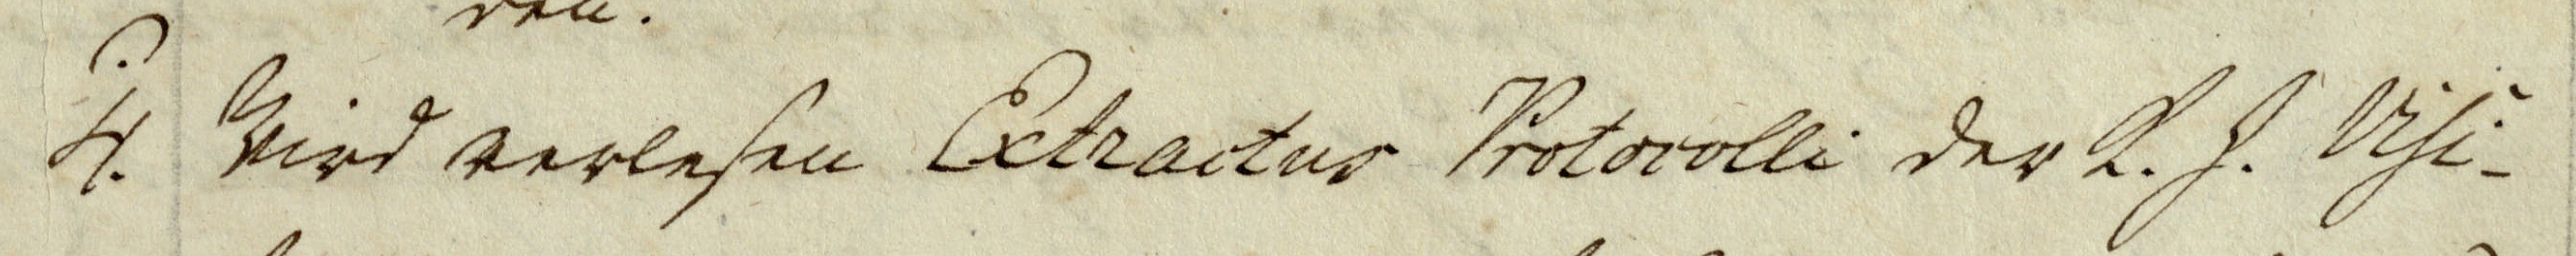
4. Wird verlesen Extractus Protocolli der K. H. Visi¬
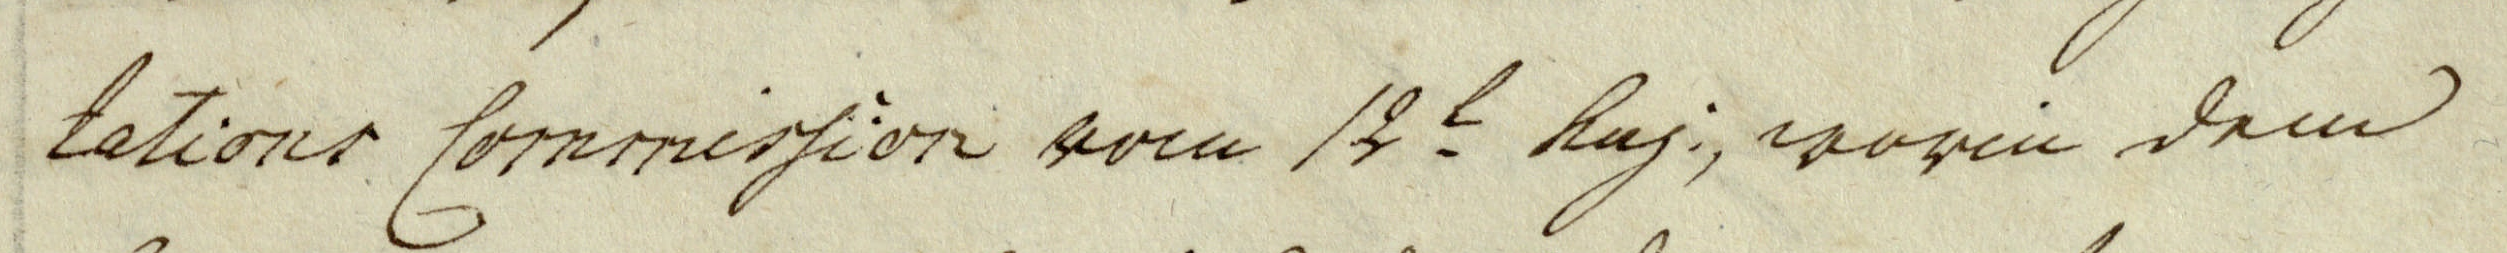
tations Commission vom 12t. huj., worin dem
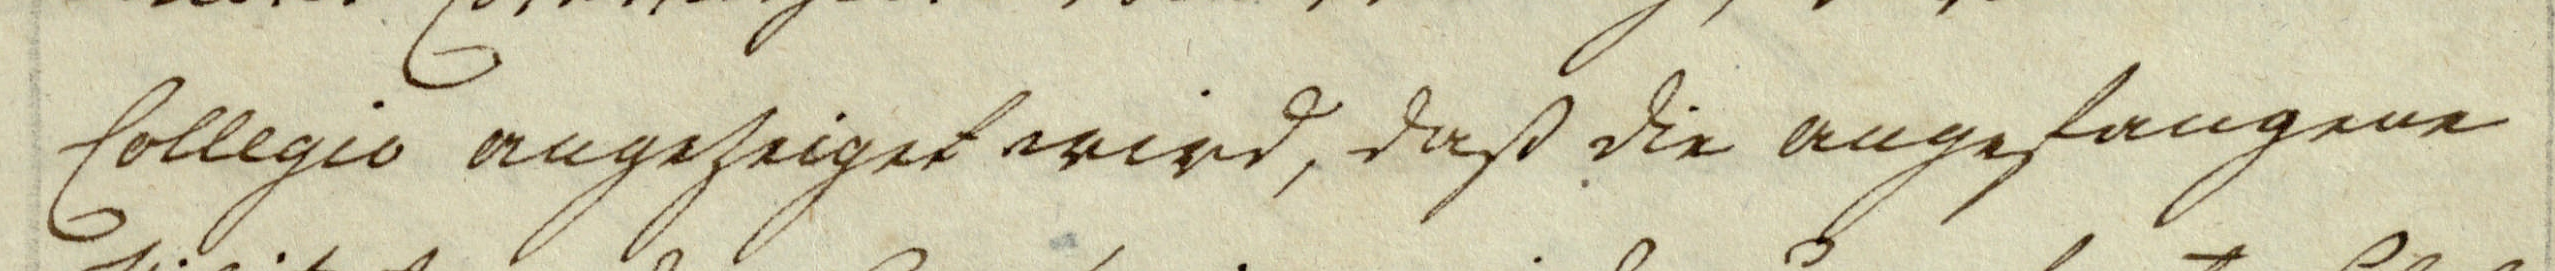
Collegio angezeigt wird, daß die angefangene
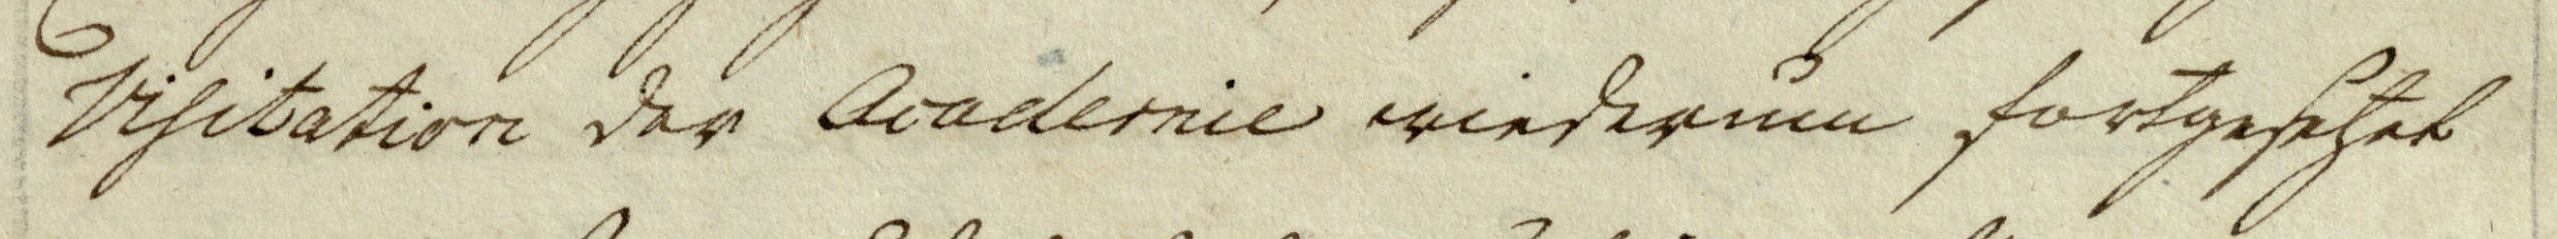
Visitation der Academie wirksam fortgesetzt
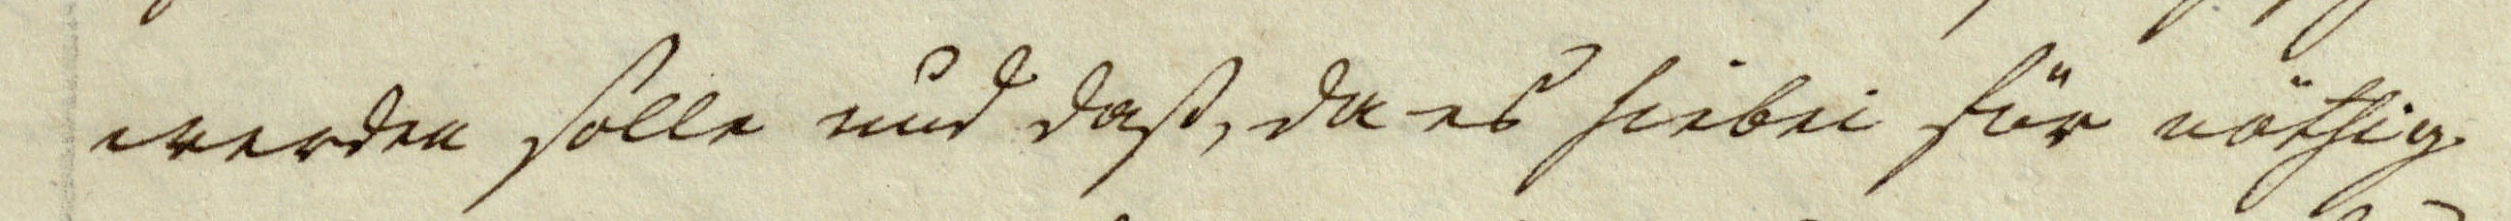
werden solle und daß, da es hiebei für nöthig
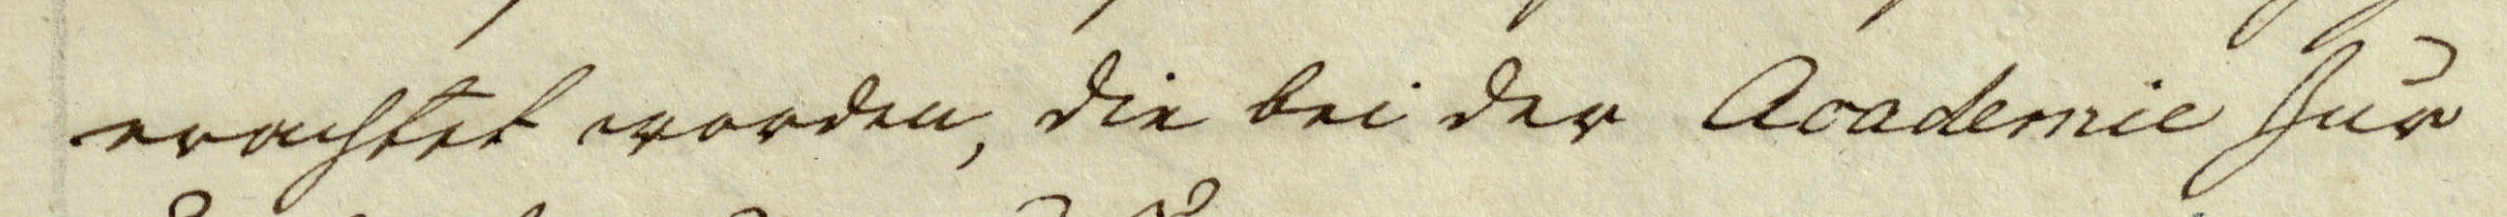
erachtet worden, die bei der Academie zur
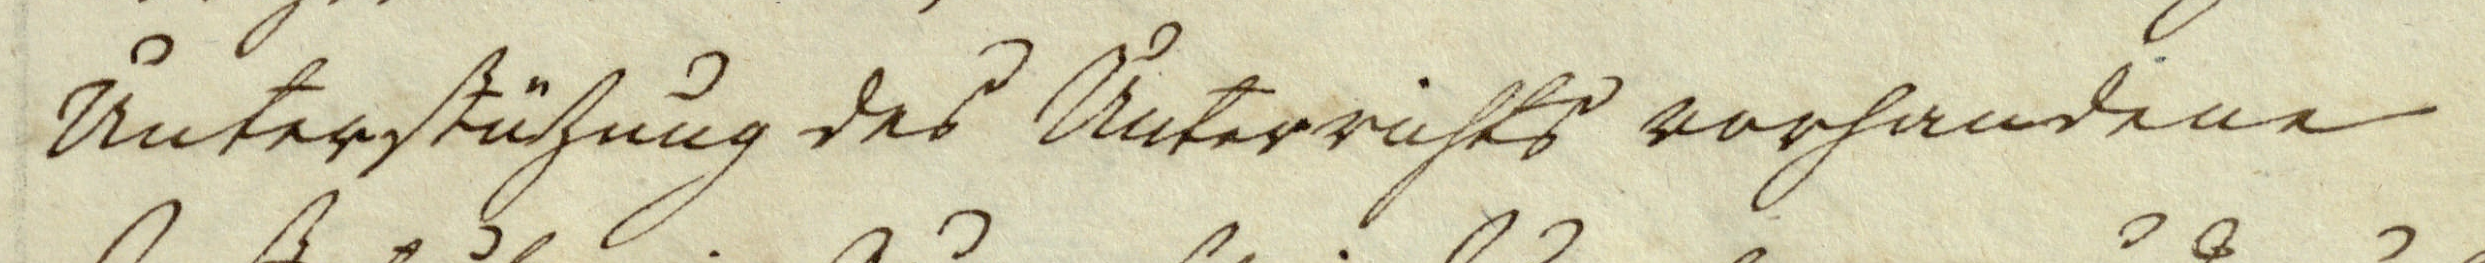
Unterstützung des Unterrichts vorhandenen
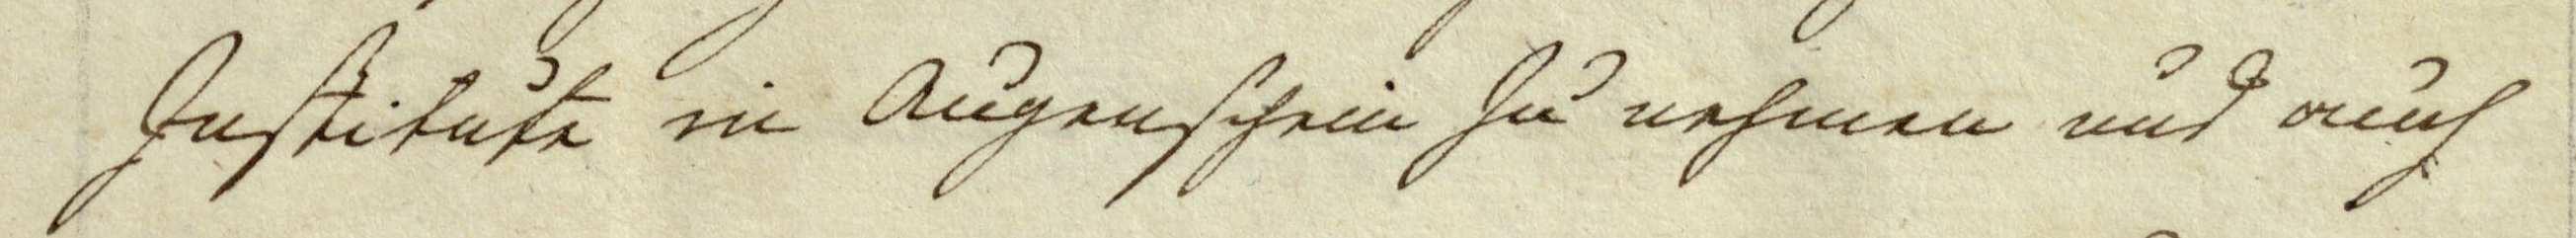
Institute in Augenschein zu nehmen und auch
